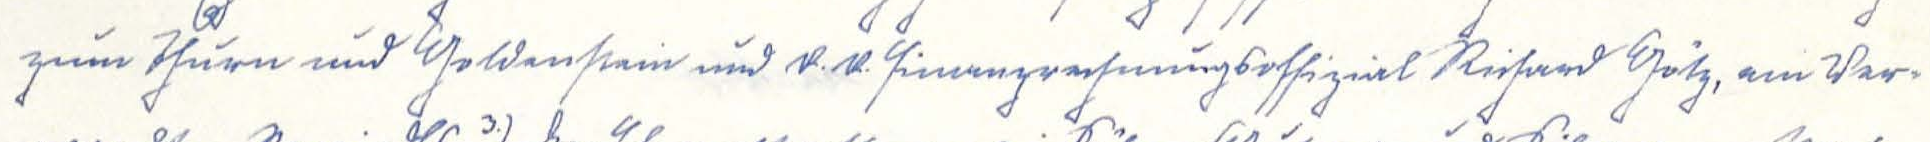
zum Thurn und Goldenstein und k. k. Finanzrechnungsoffizial Richard Götz, ein Ver-
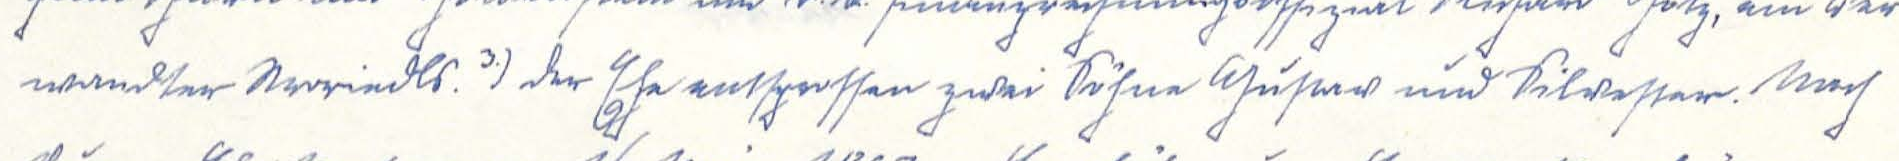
wandter Stroriedls. 3.) Der Ehe entsprossen zwei Söhne Gustav und Silvester. Nach
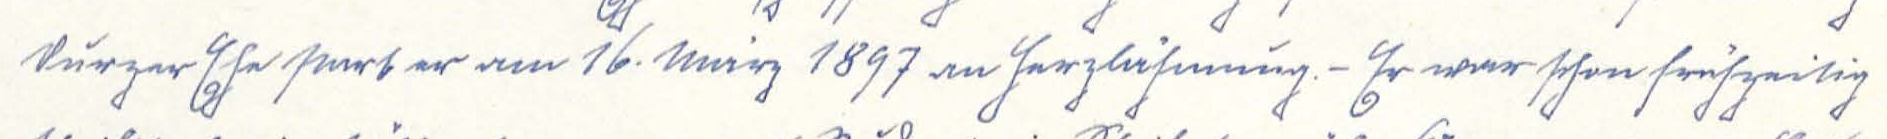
kurzer Ehe starb er am 16. März 1897 an Herzlähmung.- Er war schon frühzeitig
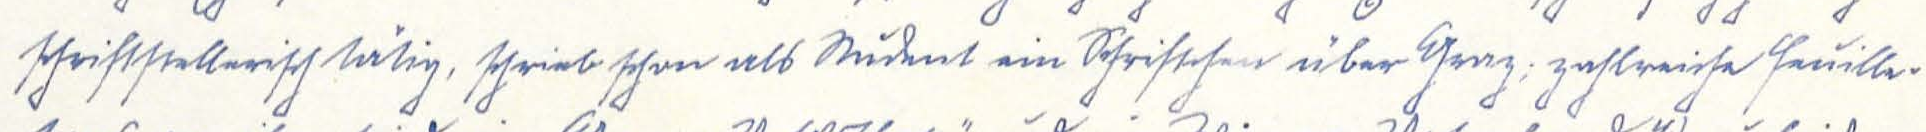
schriftstellerisch tätig, schrieb schon als Student ein Schriftchen über Graz; zahlreiche Feuille-
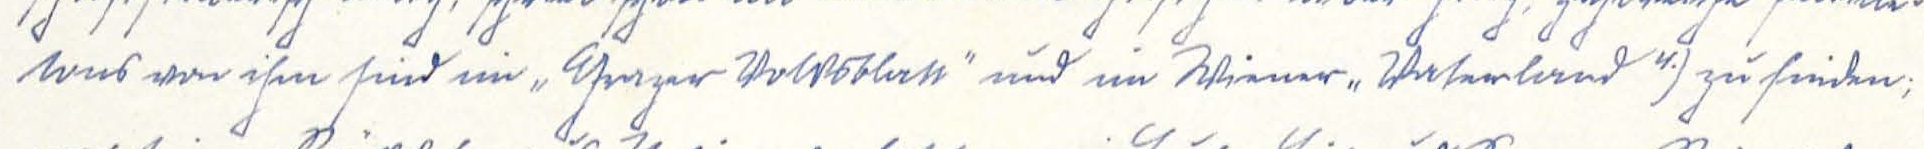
tons von ihm sind im "Grazer Volksblatt" und im Wiener „Vaterland" 4.) zu finden;
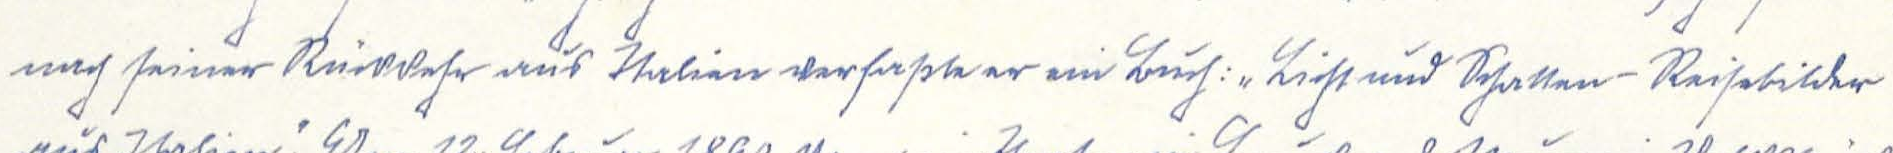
nach seiner Rückkehr aus Italien verfaßte er ein Buch: „Licht und Schatten - Reisebilder
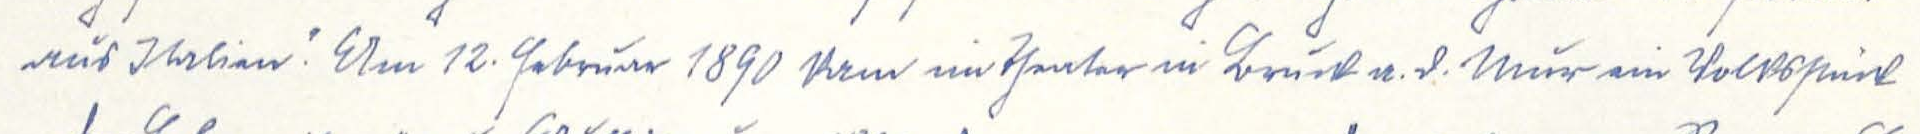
aus Italien“. Am 12. Februar 1890 kam im Theater in Bruck a. d. Mur ein Volksstück
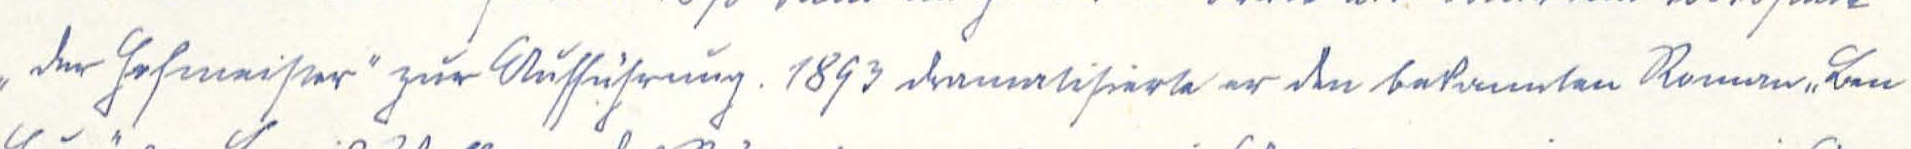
"Der Hofmeister“ zur Aufführung. 1893 dramatisierte er den bekannten Roman "Ben
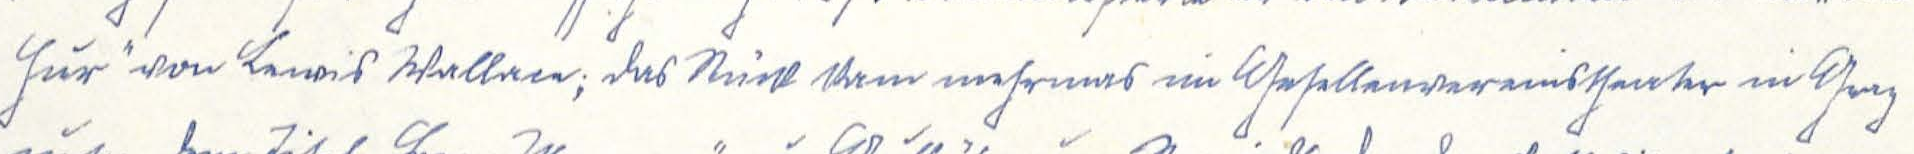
Hur“ von Lewis Wallace; das Stück kam mehrmas im Gesellenvereinstheater in Graz
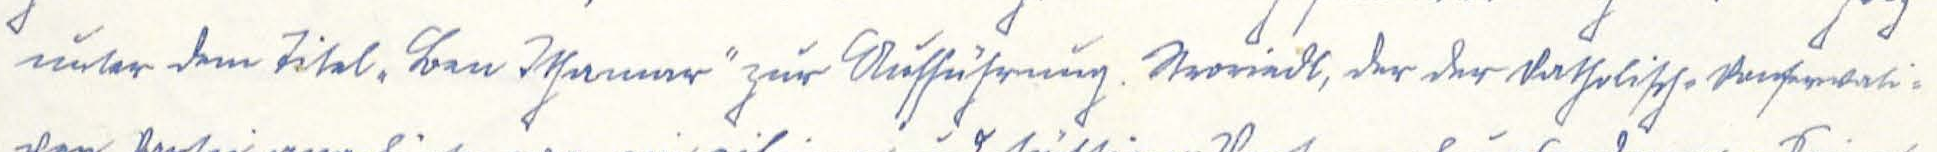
unter dem Titel "Ben Ithamar" zur Aufführung. Stroriedl, der der katholisch-konservati-
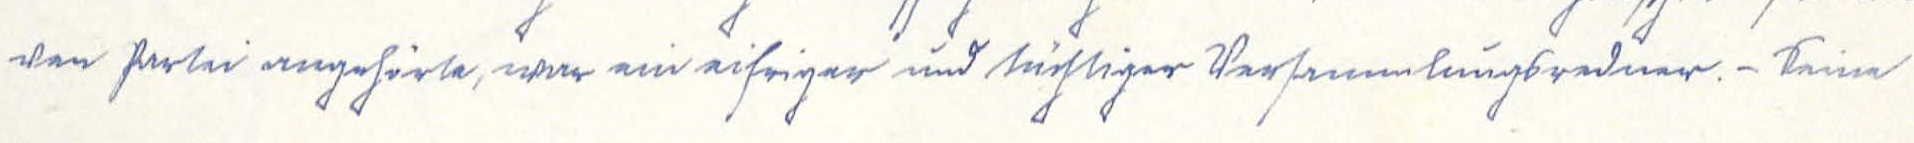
ven Partei angehörte, war ein eifriger und tüchtiger Versammlungsredner. - Seine
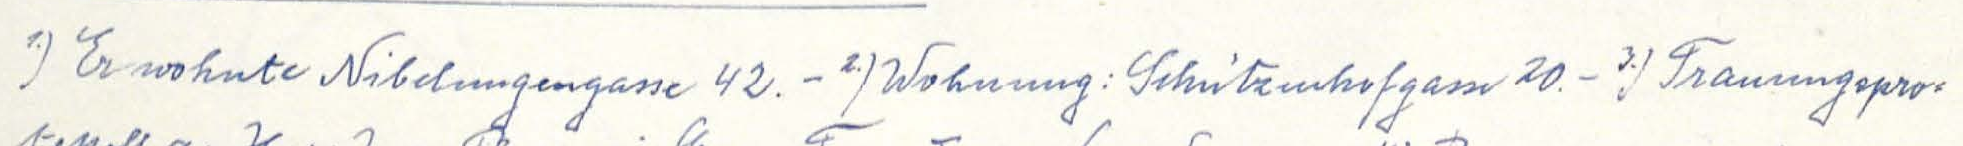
1.) Er wohnte Nibelungengasse 42.- 2.) Wohnung: Schützenhofgasse 20.- 3.) Trauungspro-
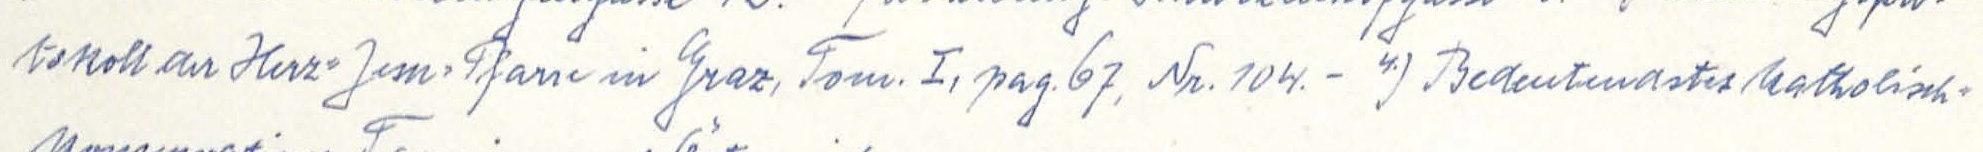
tokoll der Herz-Jesu-Pfarre in Graz, Tom. I, pag. 67, Nr. 104.- 4. Bedeutendstes katholisch-
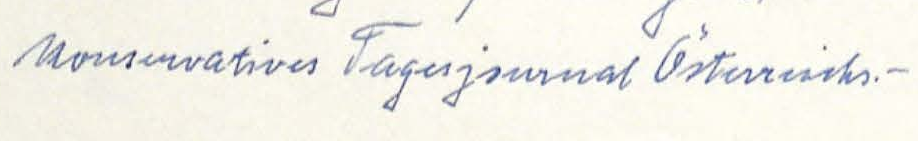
konservatives Tagesjournal Österreichs.-
